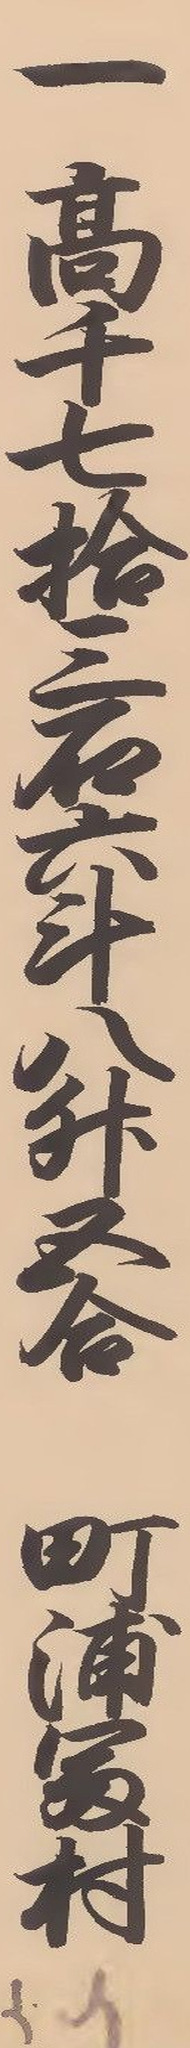一高千七拾三石六斗八升五合町浦富村
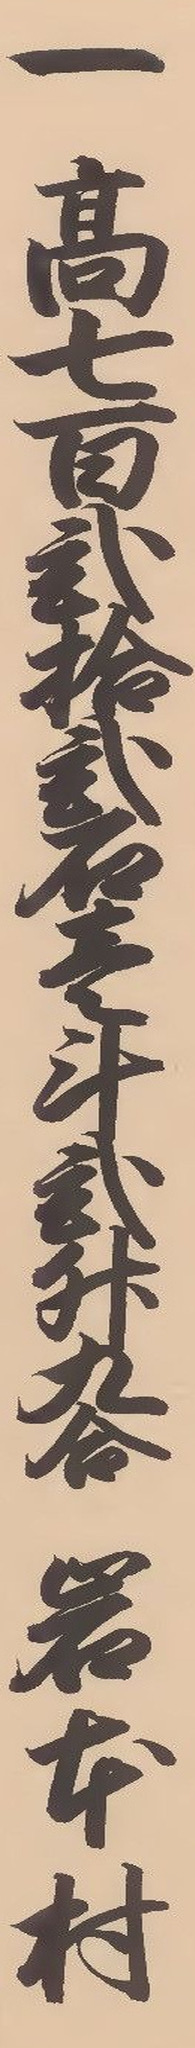一高七百弐拾弐石壱斗弐升九合岩本村
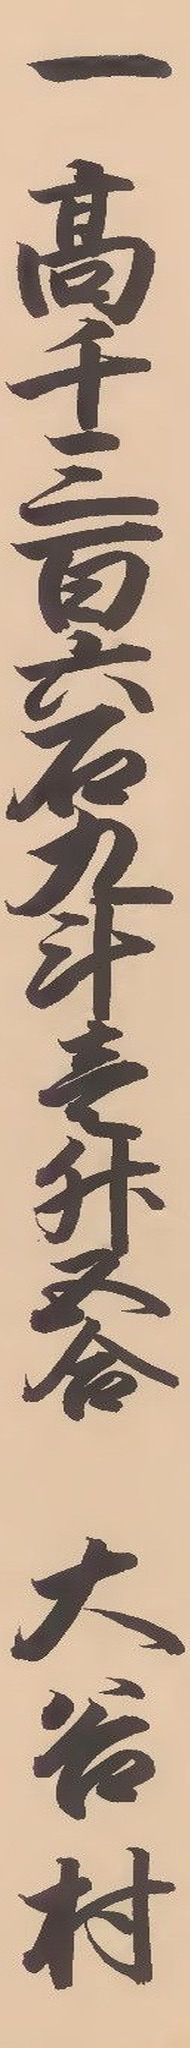一高千三百六石九斗壱升五合大谷村
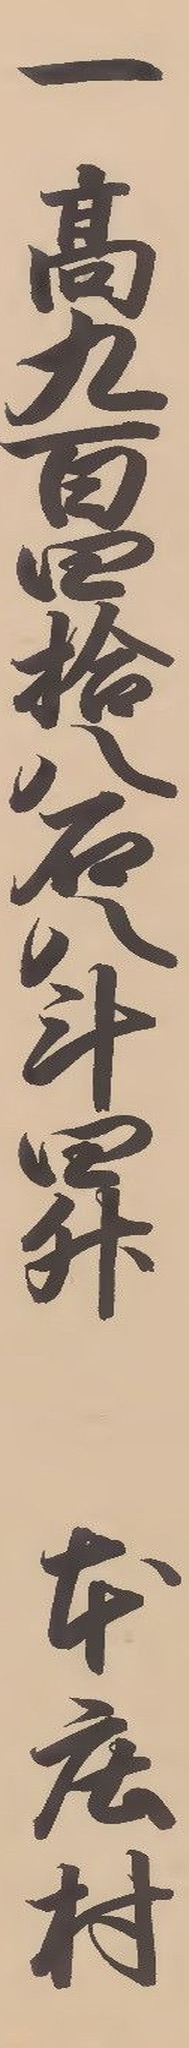一高九百四拾八石八斗四升本庄村
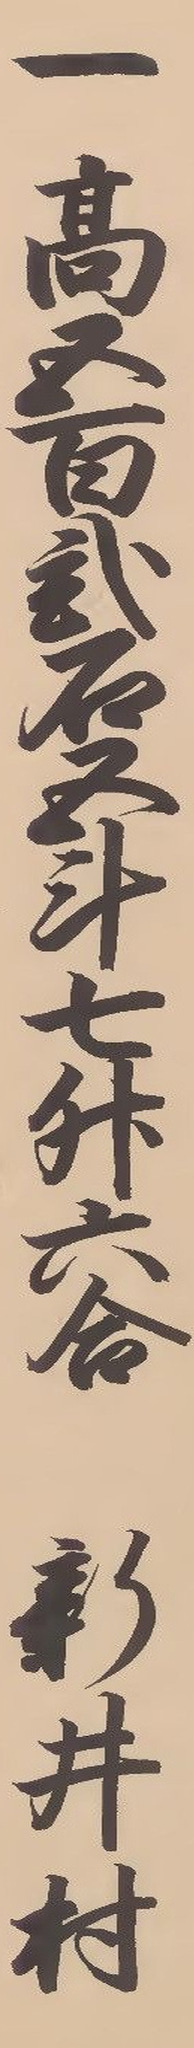一高五百弐石五斗七升六合新井村
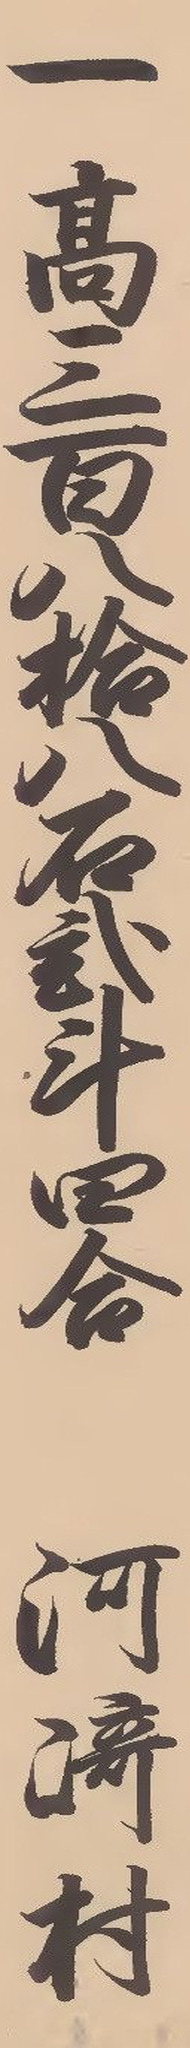一高三百八拾八石弐斗四合河崎村
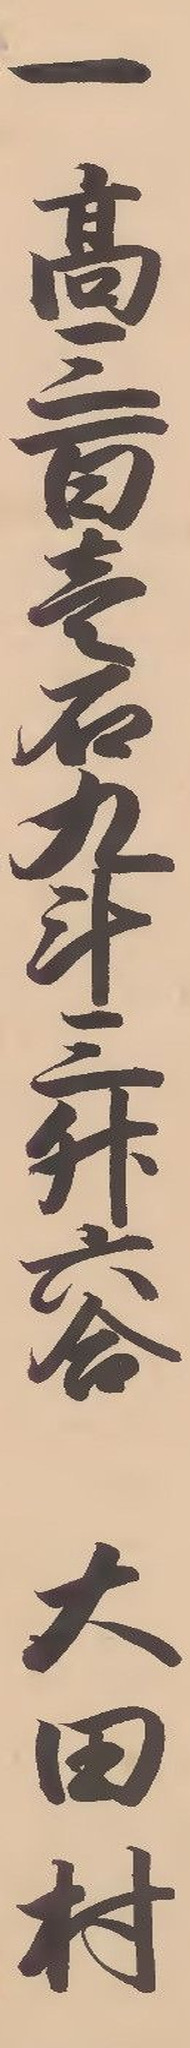一高三百壱石九斗三升六合大田村

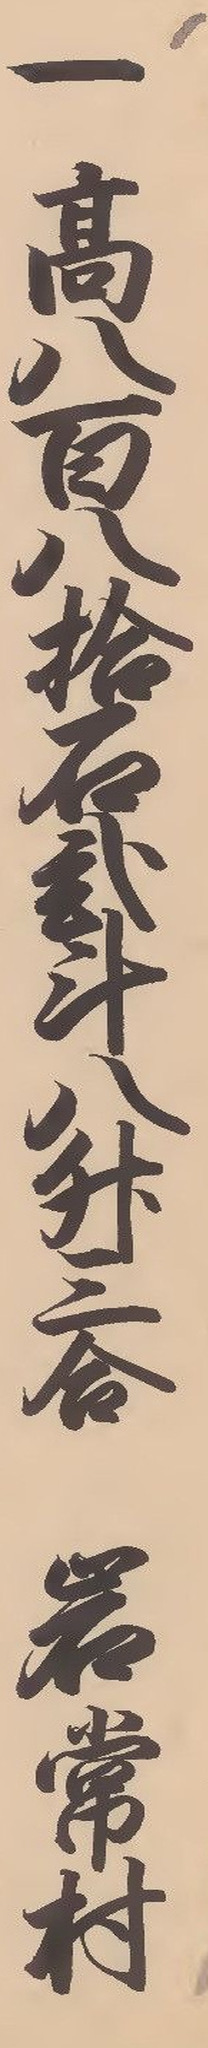一高八百八拾石弐斗八升三合岩常村
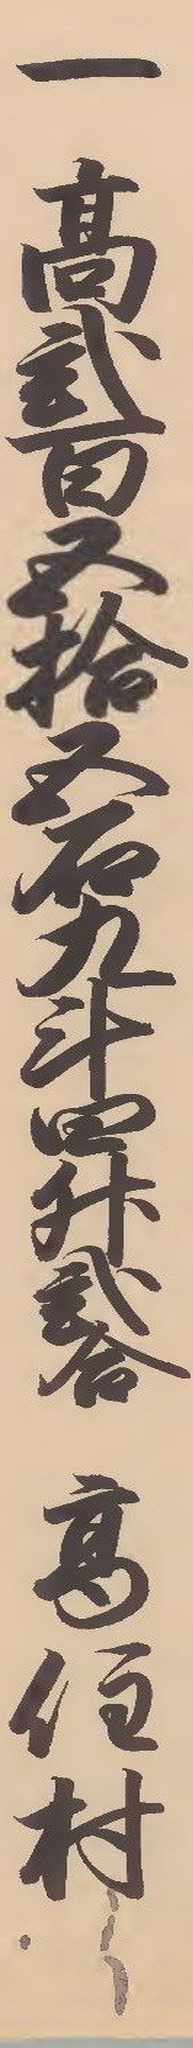一高弐百五拾五石九斗四升弐合高住村
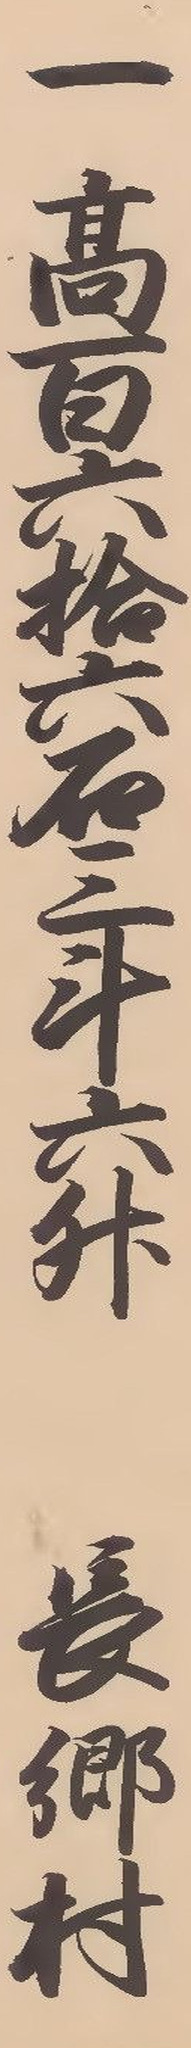一高百六拾六石三斗六升長郷村
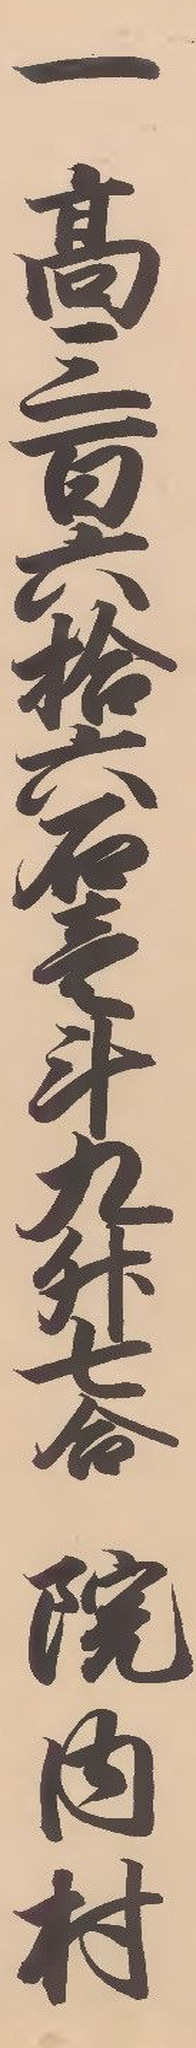一高三百六拾六石壱斗九升七合院内村
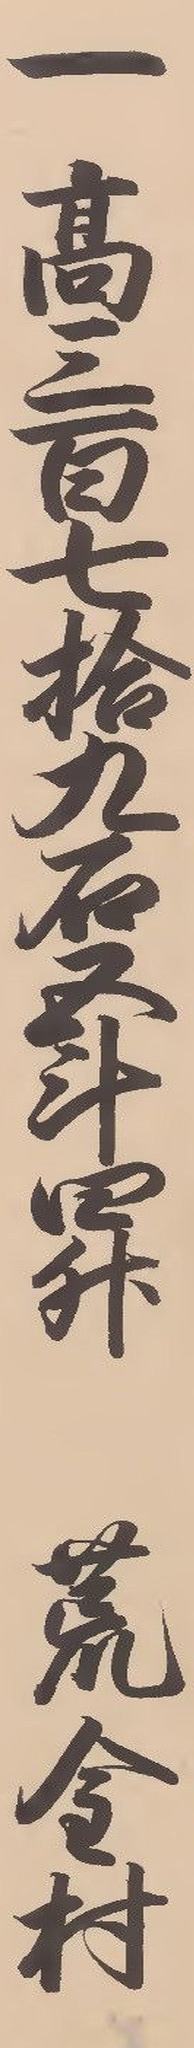一高三百七拾九石五斗四升荒金村
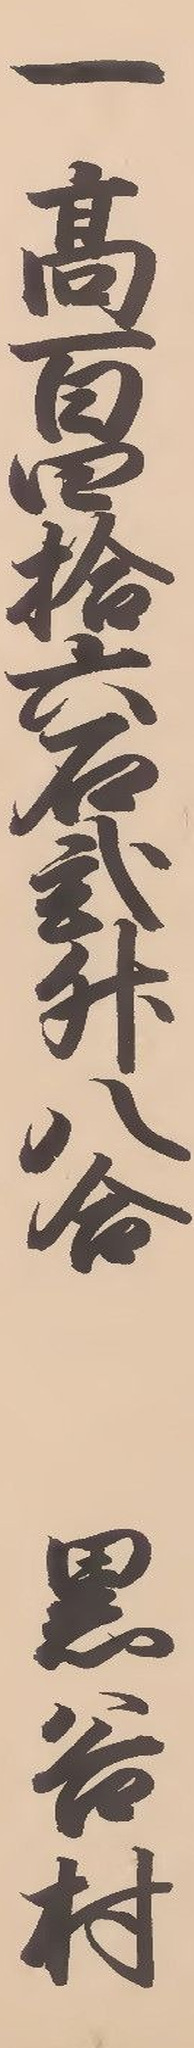一高百四拾六石弐升八合黒谷村
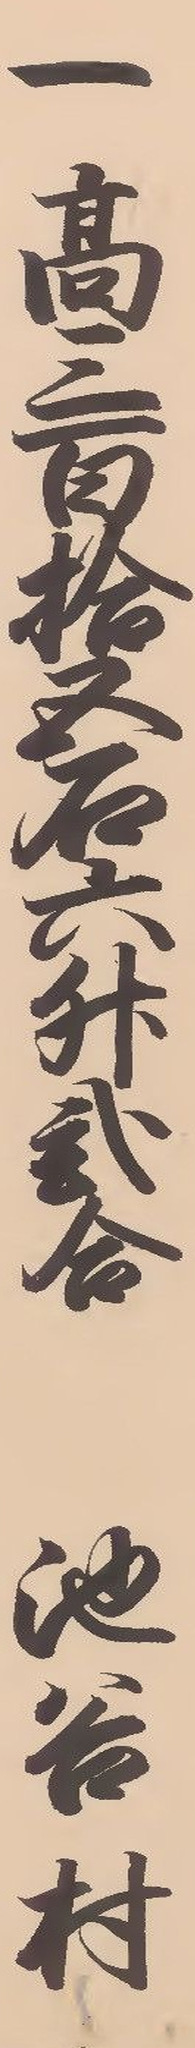一高三百拾五石六升弐合池谷村
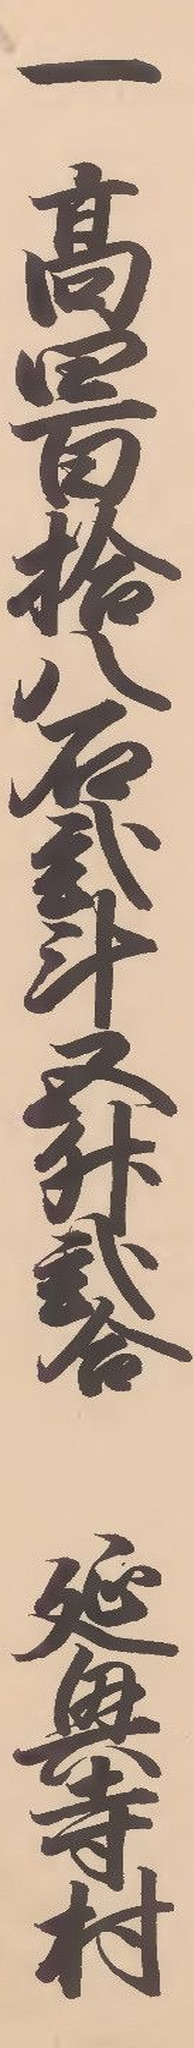一高四百拾八石弐斗五升弐合延興寺村

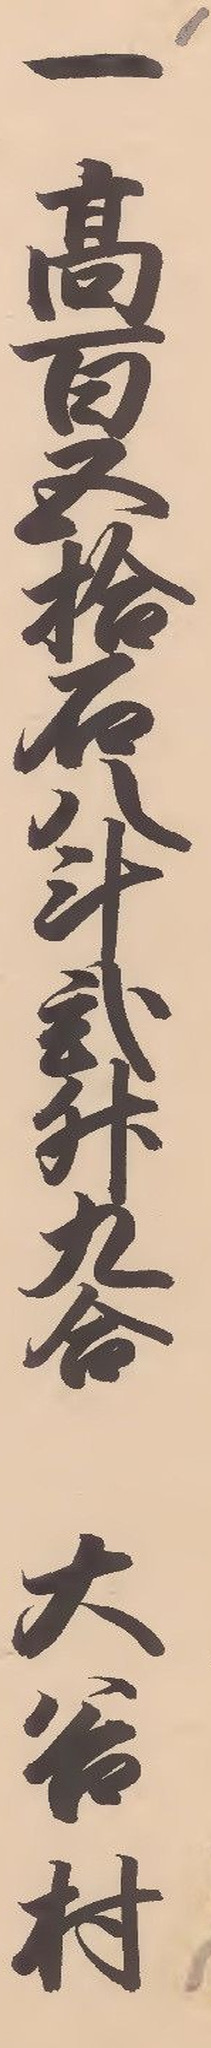一高百五拾石八斗弐升九合大谷村
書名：因幡国郷帳
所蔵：国立公文書館 National Archives of Japan
